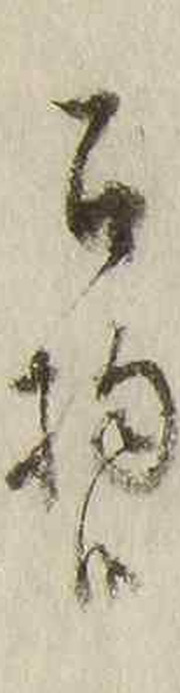召抱候

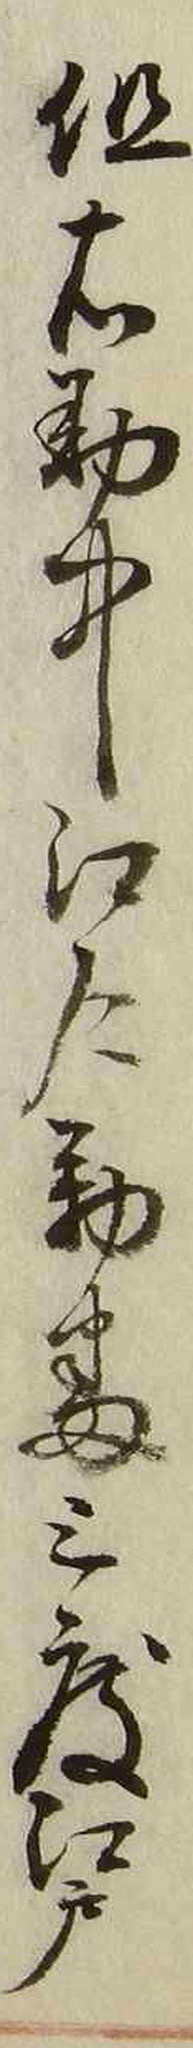但右勤中江戸勤番三度江戸
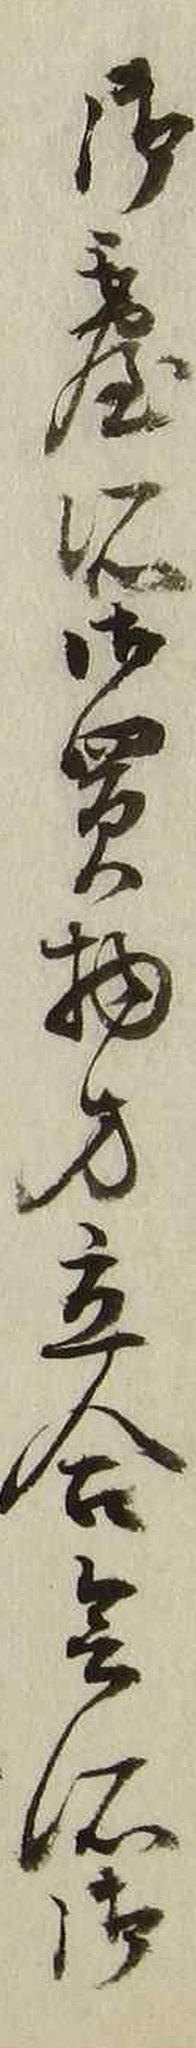御台所御買物方立合会所御
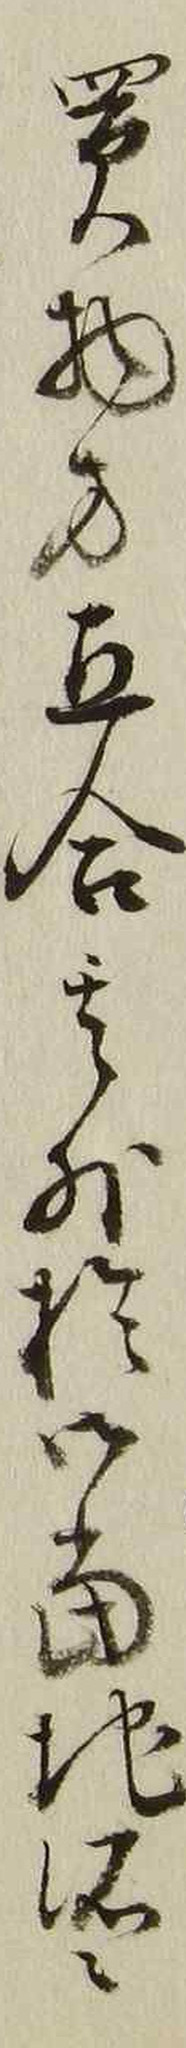買物方立合其外於御当地所々
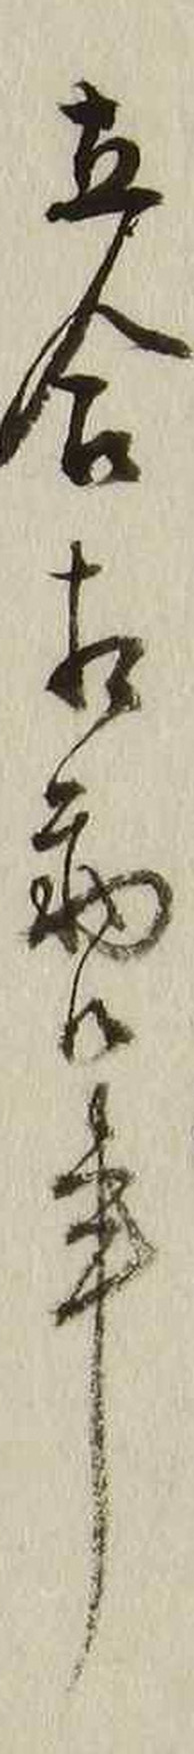立合相勤候事
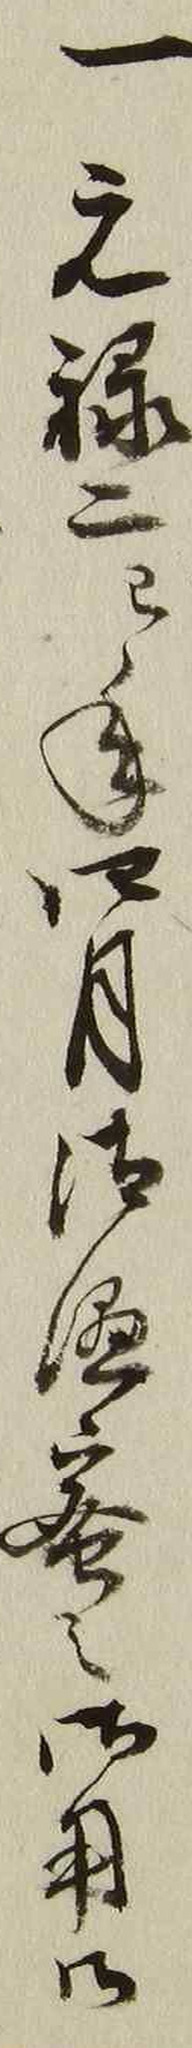一元禄二巳年四月御隠客之御用御
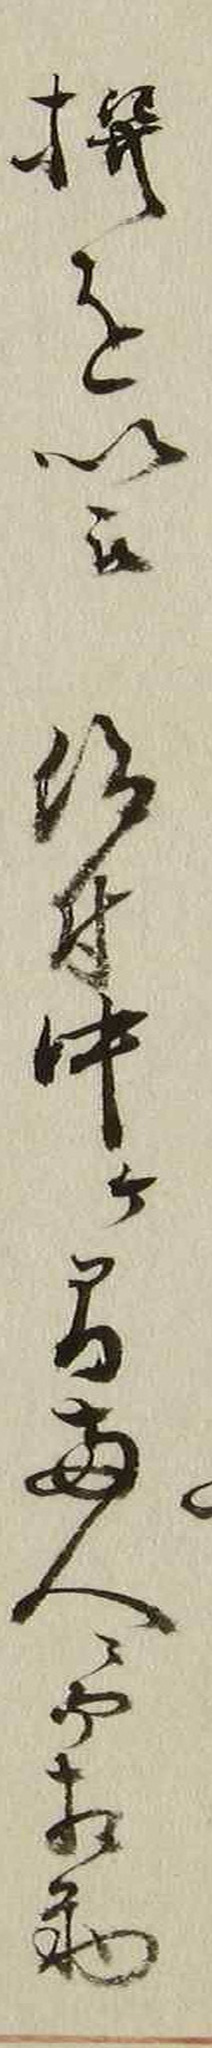撰を以被仰付中ヶ間両人ニ而相勤
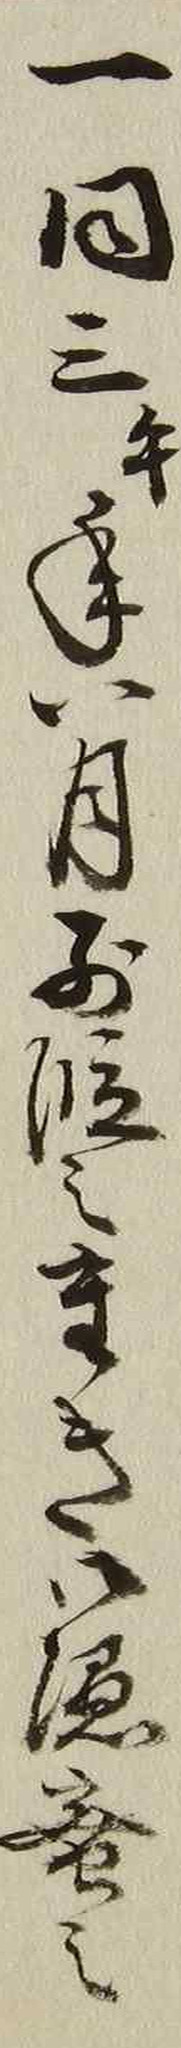一同三午年八月別段之重き御隠客之
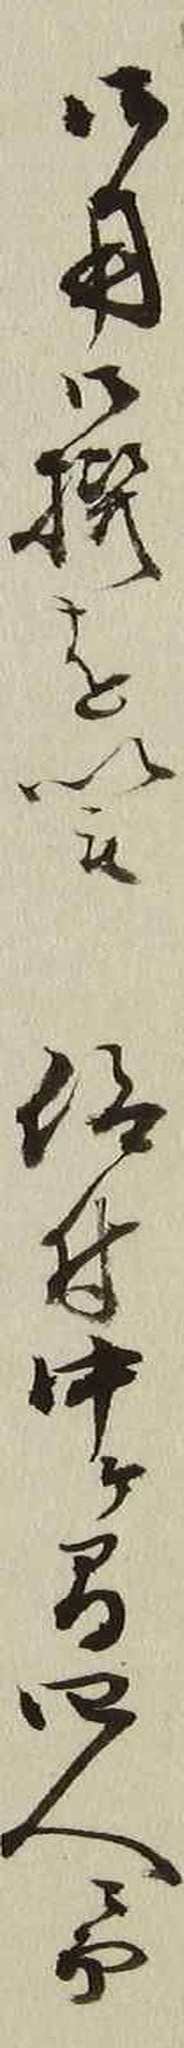御用御撰を以被仰付中ヶ間四人ニ而
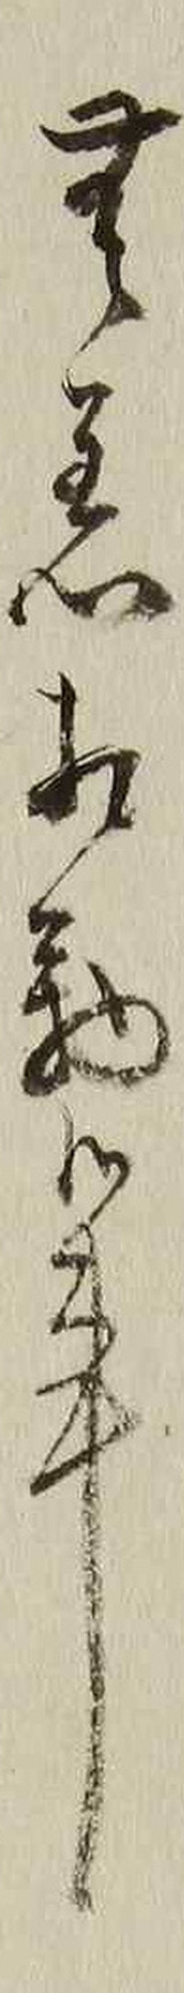無恙相勤候事
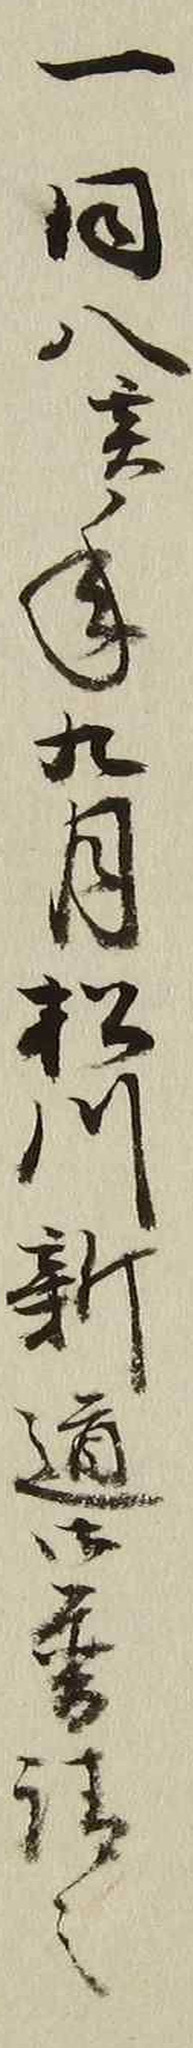一同八亥年九月松川新道御普請之
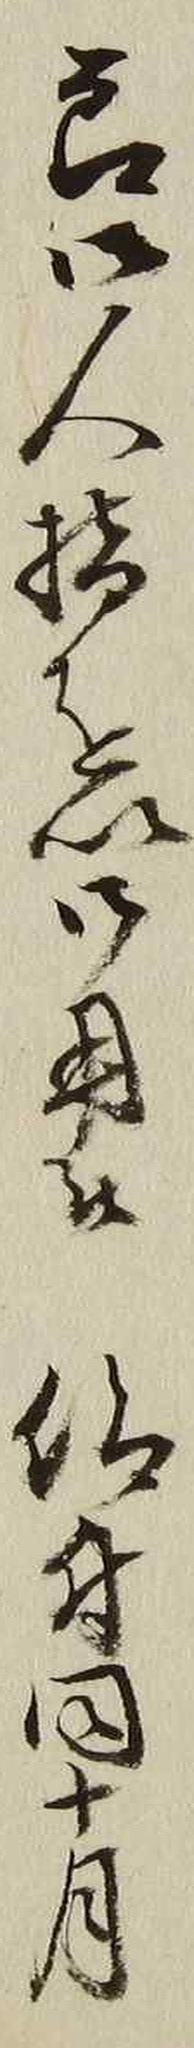節御人指を以御用被仰付同十月
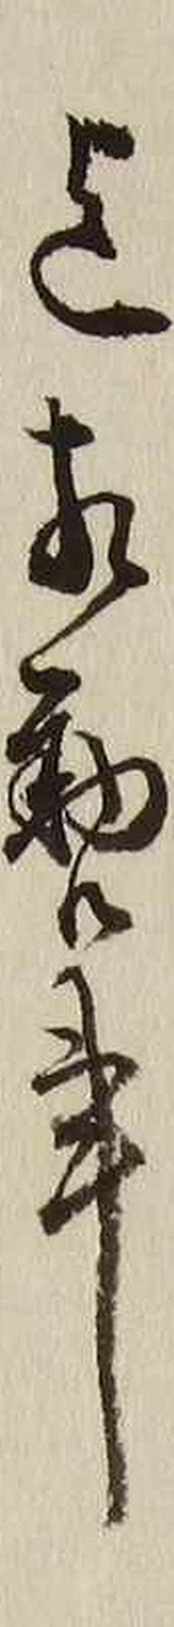迄相勤候事
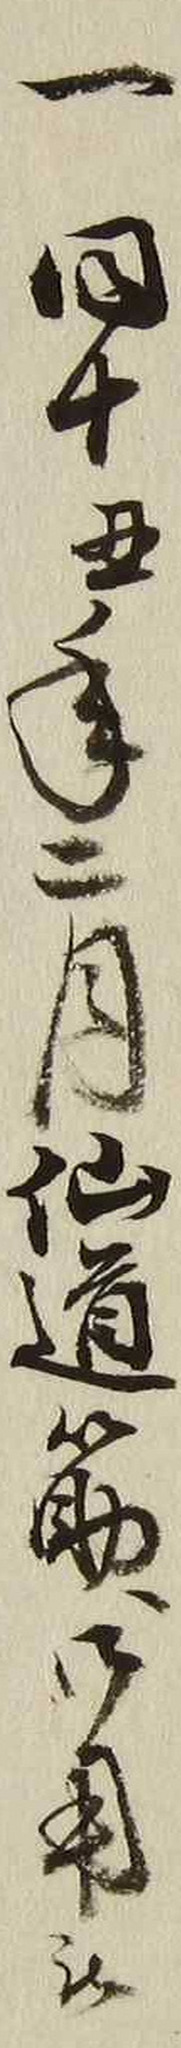一同十丑年二月仙道筋へ御用被
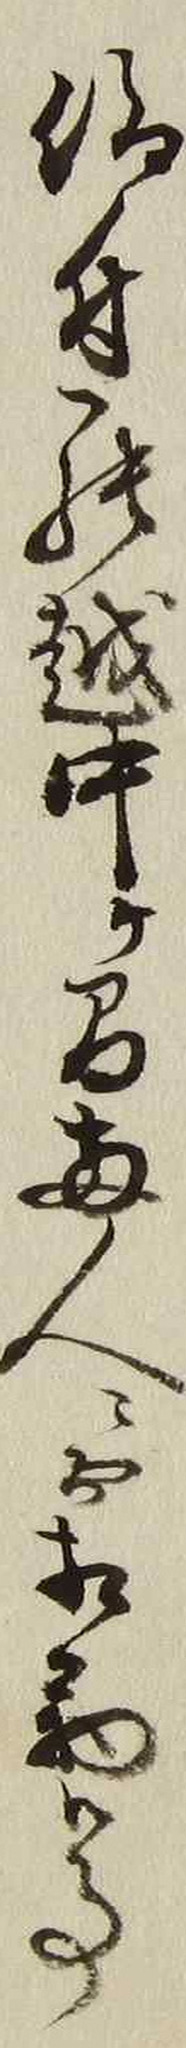仰付罷越中ヶ間両人ニ而相勤候事
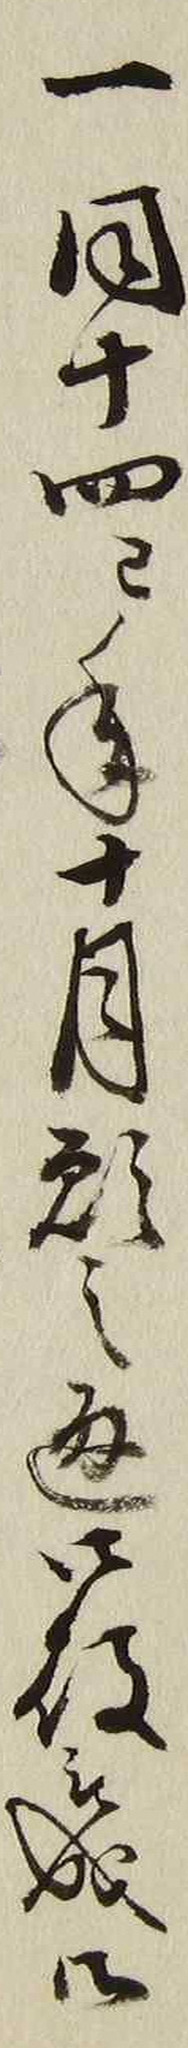一同十四巳年十月願之通御役被成御
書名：諸士系譜　巻之36　は之部4
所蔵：会津若松市立会津図書館
